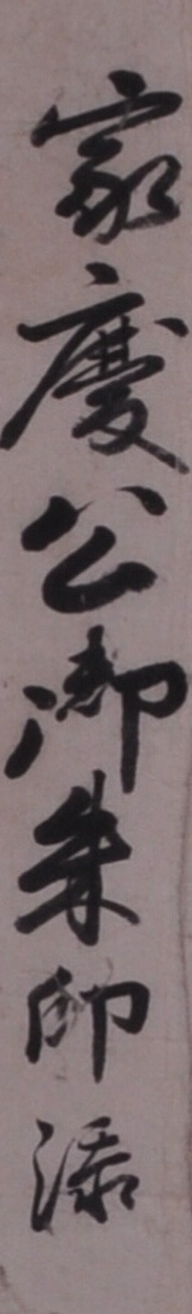家慶公御朱印添
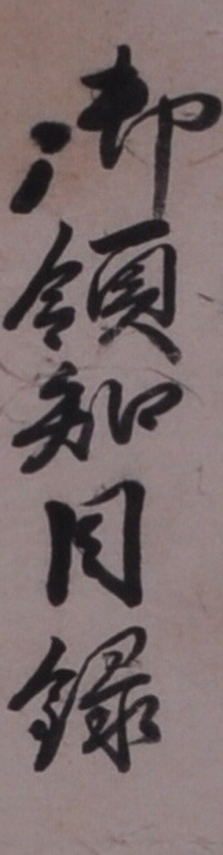御領知目録
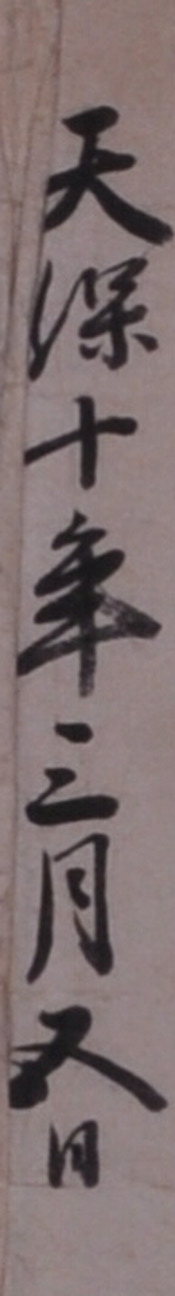天保十年三月五日

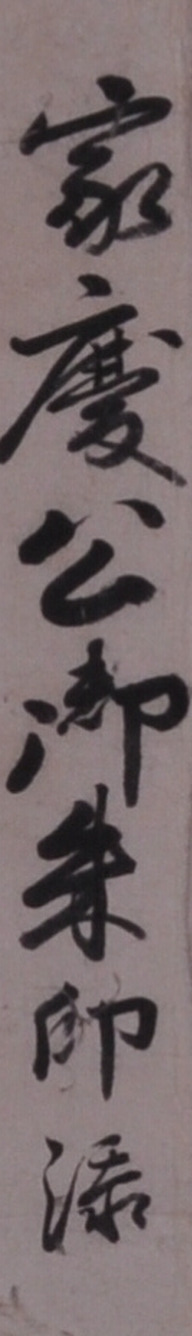家慶公御朱印添
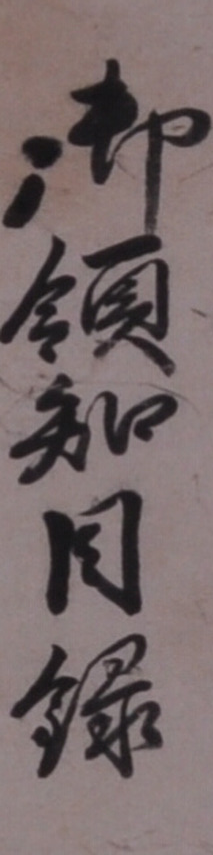御領知目録
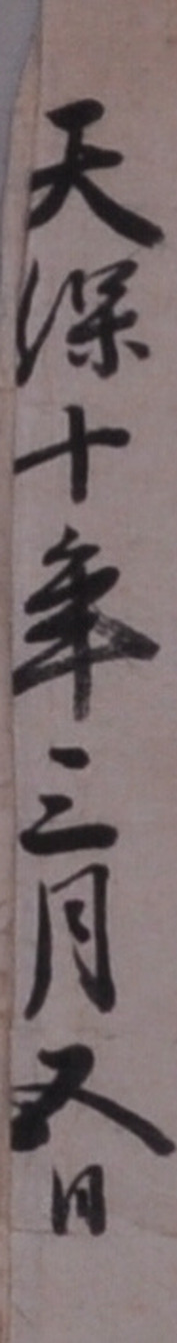天保十年三月五日
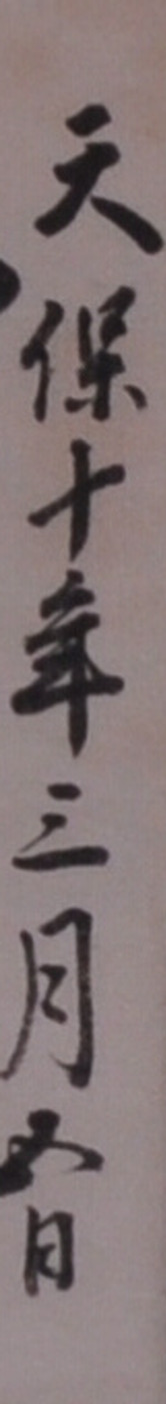天保十年三月五日
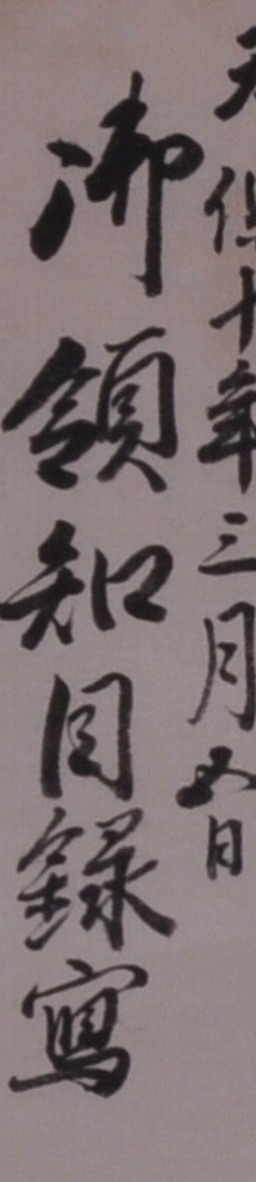御領知目録写

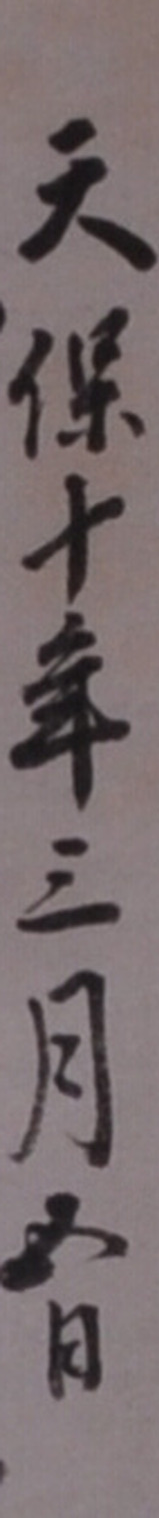天保十年三月五日
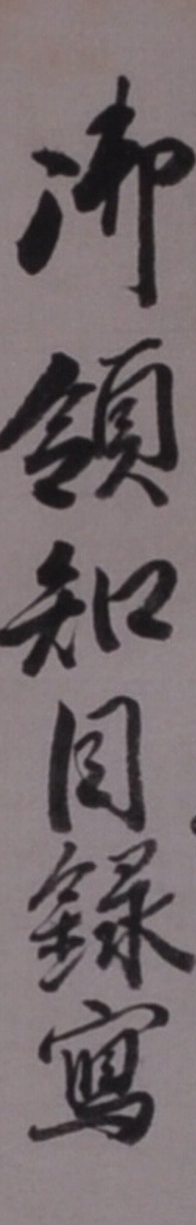御領知目録写

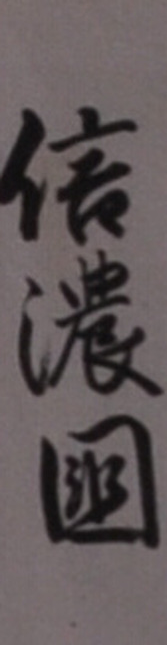信濃国
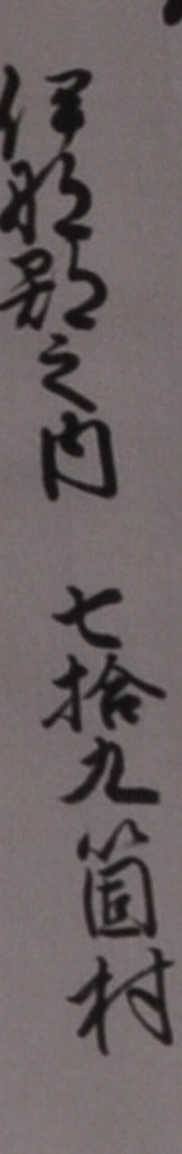伊那郡之内七拾九箇村
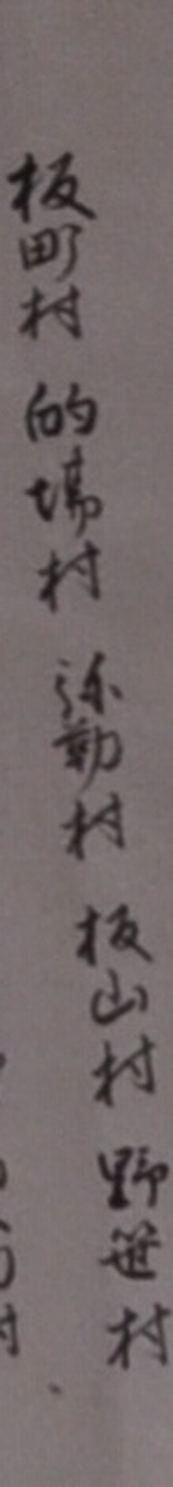板町村的場村弥勒村板山村野笹村
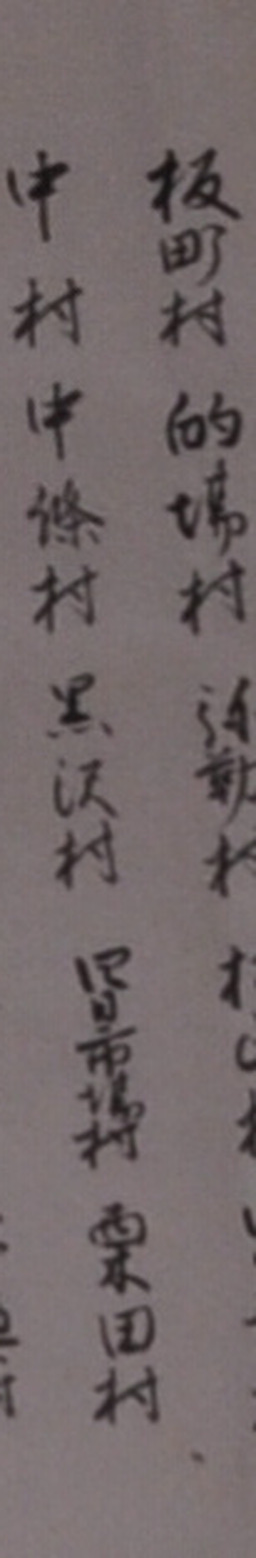中村中条村黒沢村四日市場村栗田村
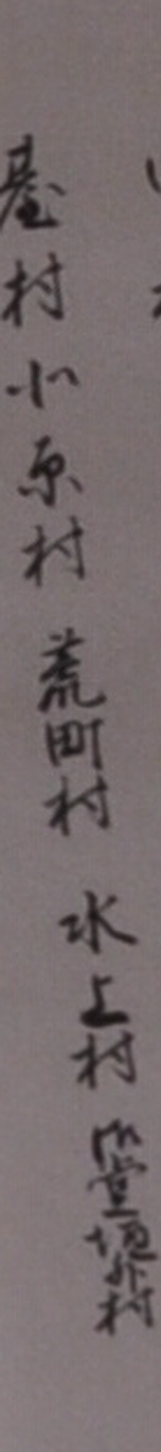台村北原村荒町村水上村御堂垣外村
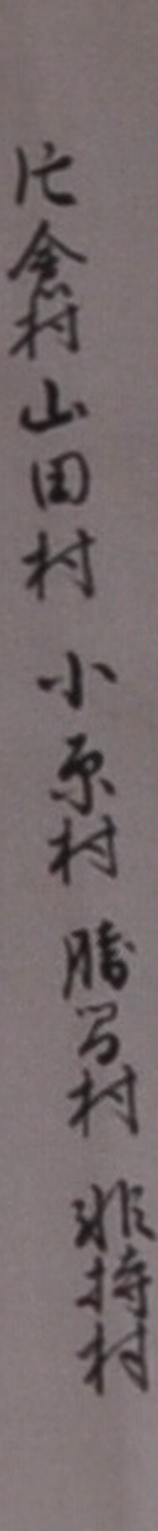片倉村山田村小原村勝間村非持村
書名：御朱印写・領地目録
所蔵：伊那市立高遠町図書館・合同会社AMANE
